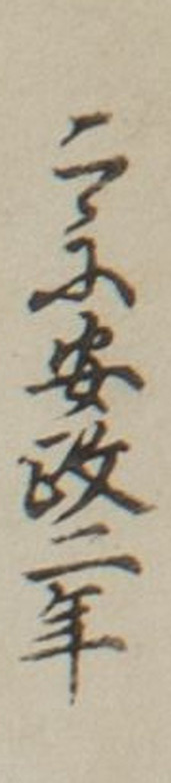ここに安政二年
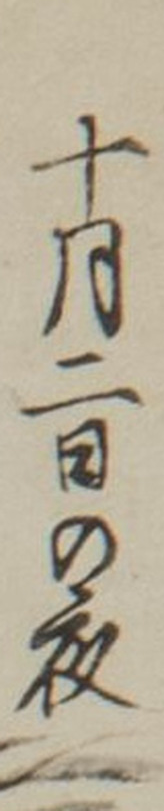十月二日の夜
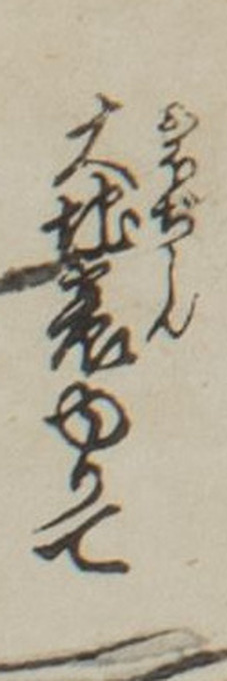大地震ありて
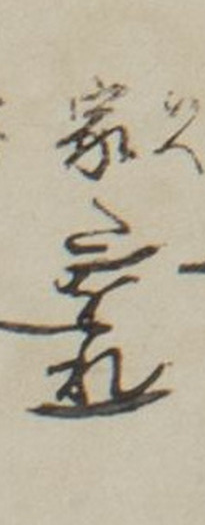家たをれ
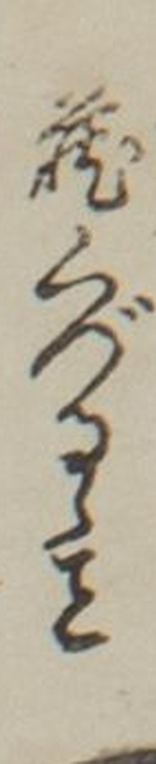蔵くづるゝを
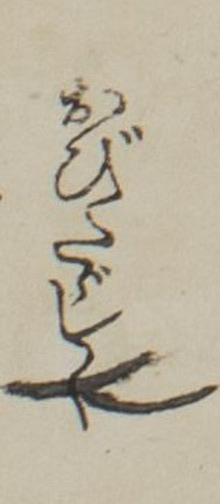おびたゞしく
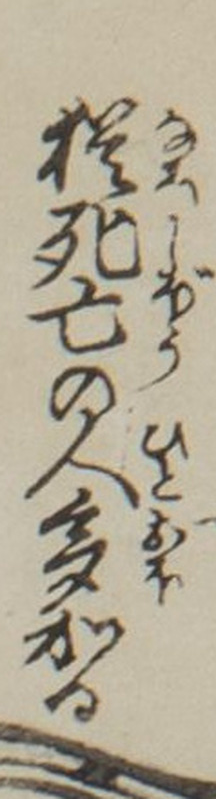猶死亡の人多かる
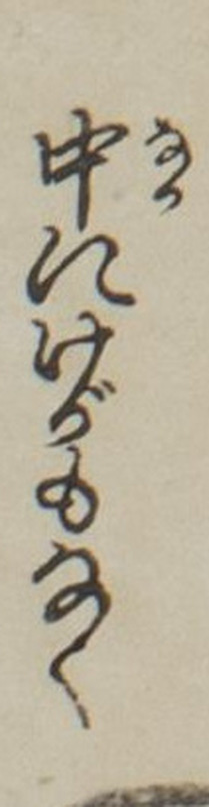中にけがもなく
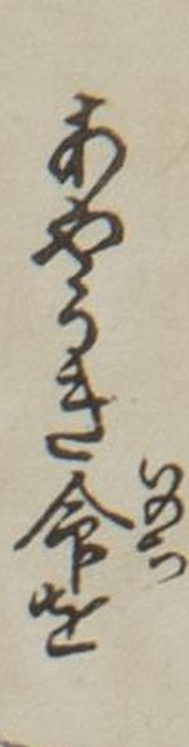あやうき命を
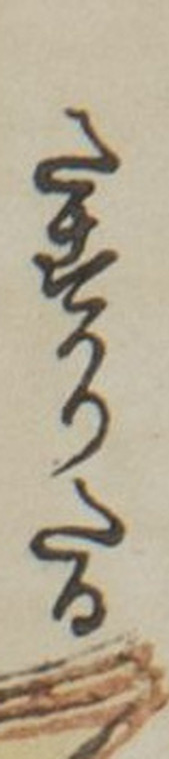たすかりたる
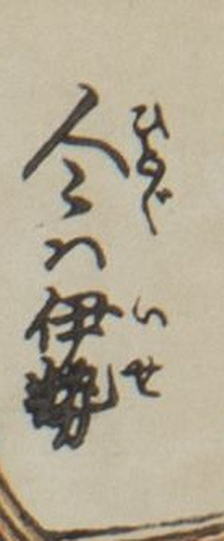人々は伊勢
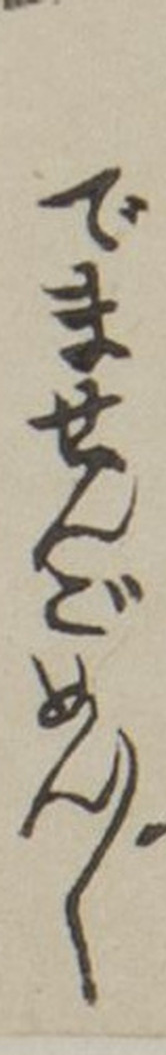でませんごめん〳〵
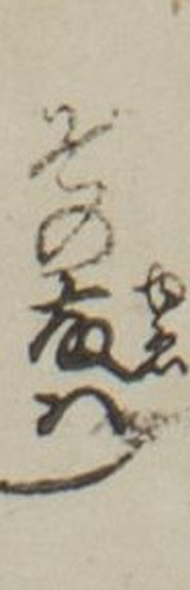その故は
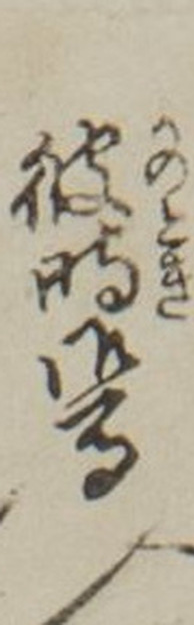彼時御馬
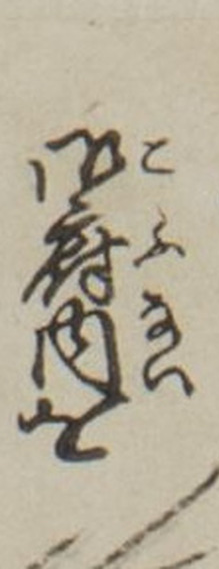御府内を
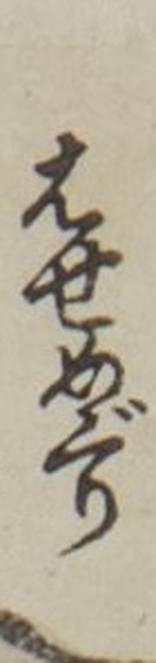はせめぐり
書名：鯰を蹴散らす伊勢神宮神馬
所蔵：あいおいニッセイ同和損保株式会社
